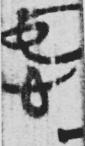忠
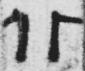北（邶）
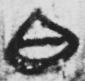白（柏）
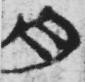舟
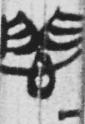悶
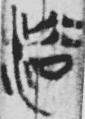浴（谷）
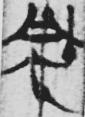風
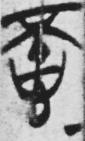○（悲）
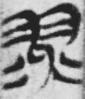翏（蓼）
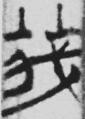莪
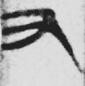又（有）
